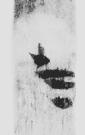十三
